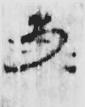十月
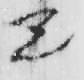巳
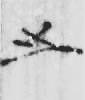之
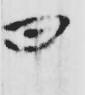日
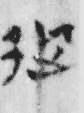○（卜）
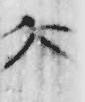大
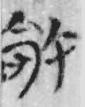○（令）
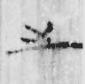之
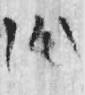州
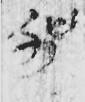加
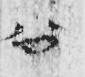公
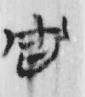周
